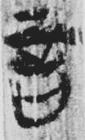言
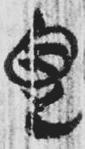見
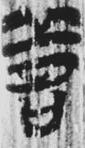善
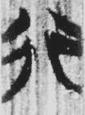行
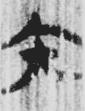內（納）
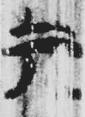亓（其）
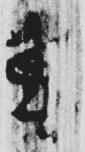身（身）
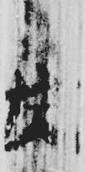安（焉）
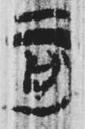可
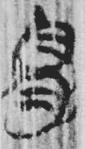胃（謂）
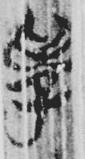學
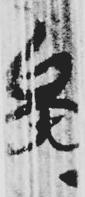矣
